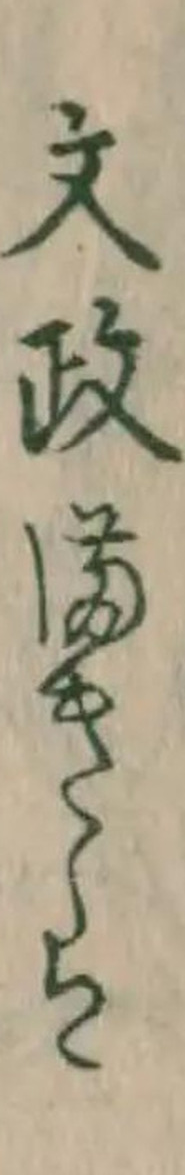文政まきは
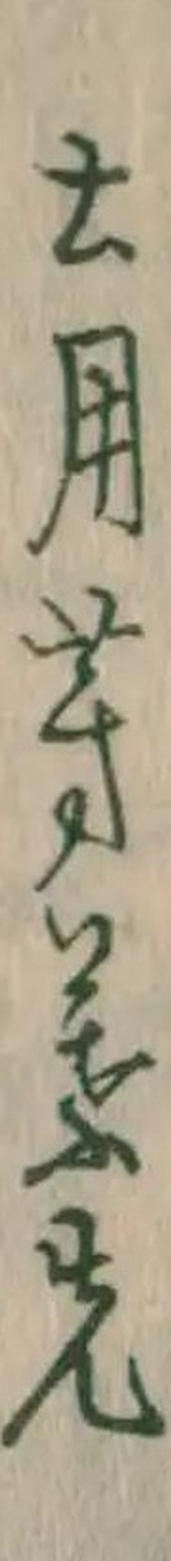土用芽葉先
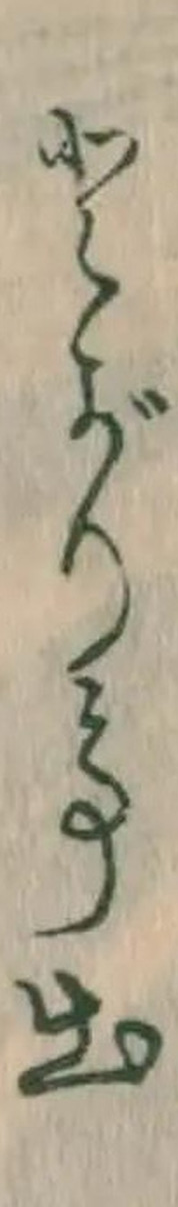とがりて出

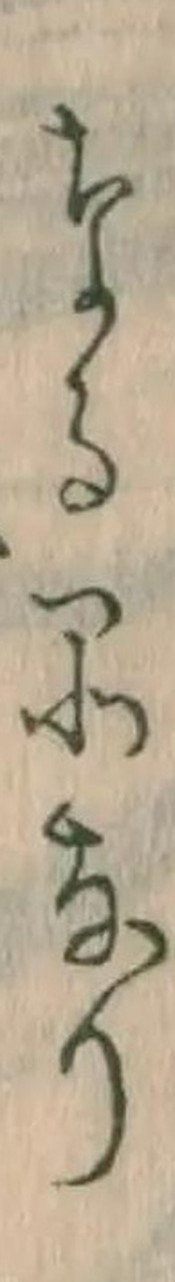なる品なり
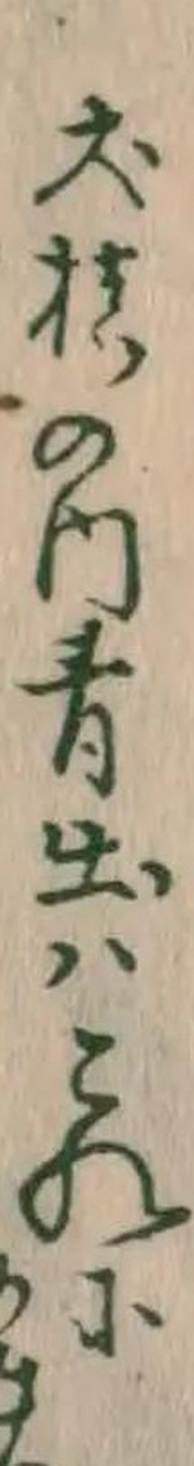犬槙の内青出はこれに
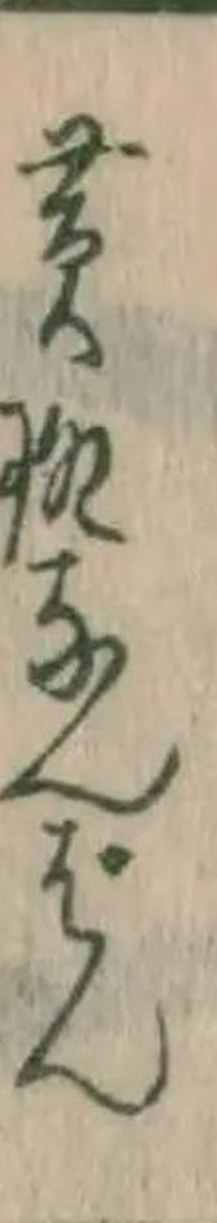黄斑なんばん
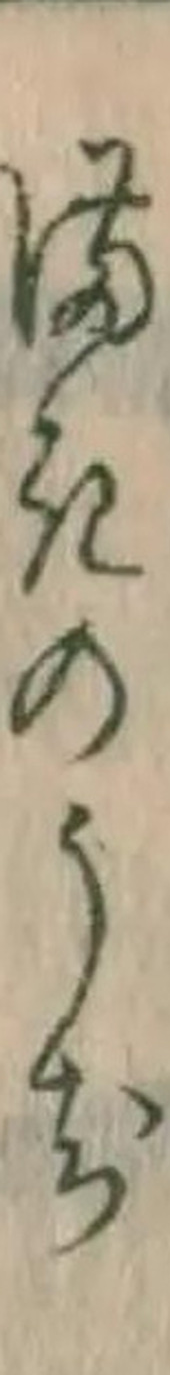まきのうち
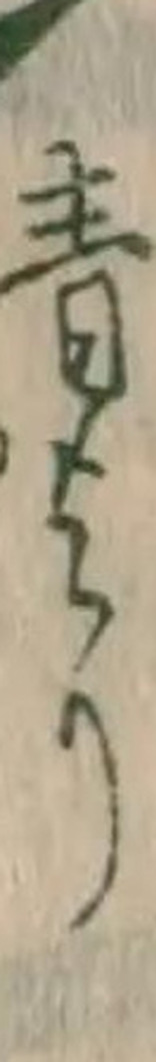青より
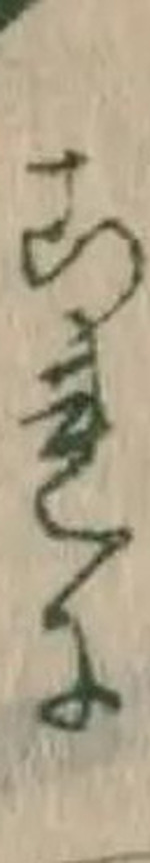これに

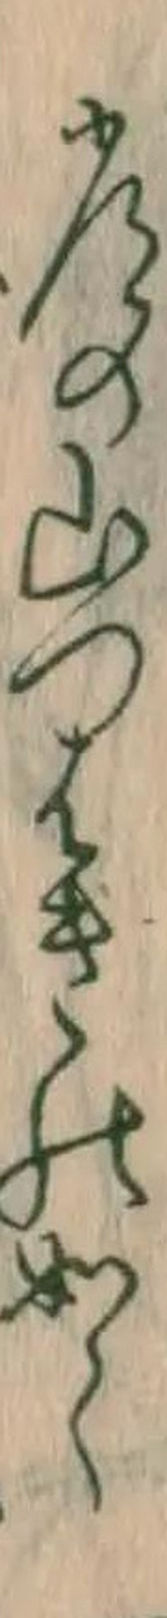常の山つはきの如く
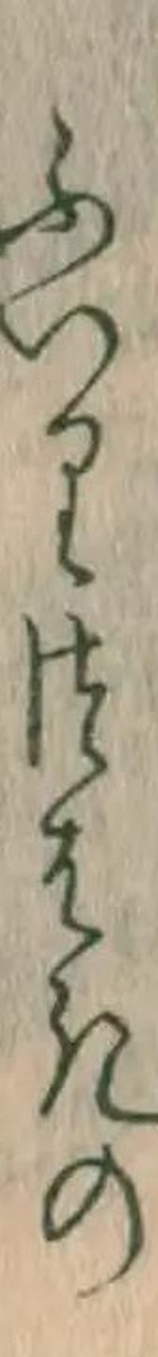よふいりつはきの
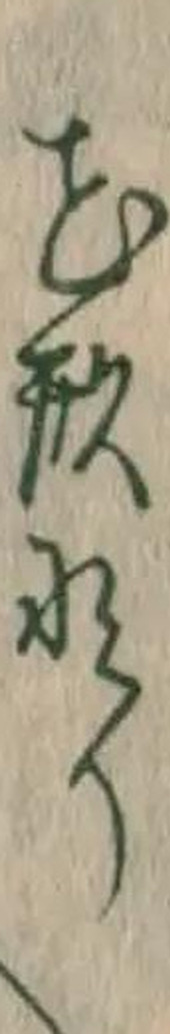花形なり
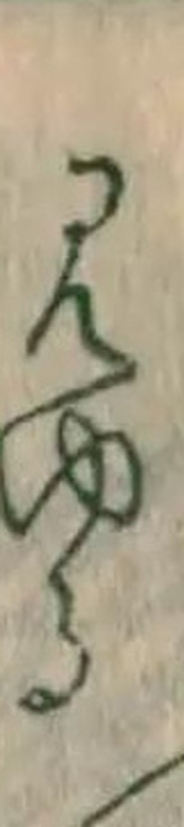見ゆる
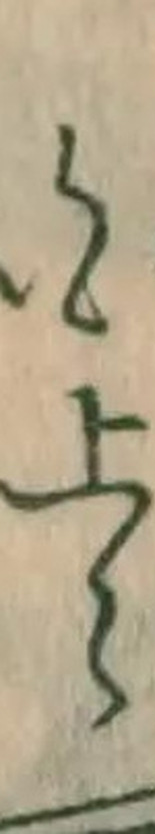白上々
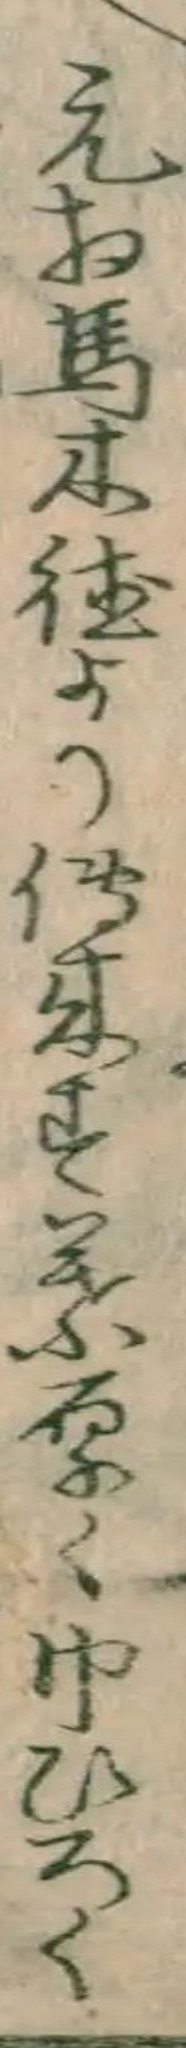元相馬木徳より伝来す葉厚く巾ひろく
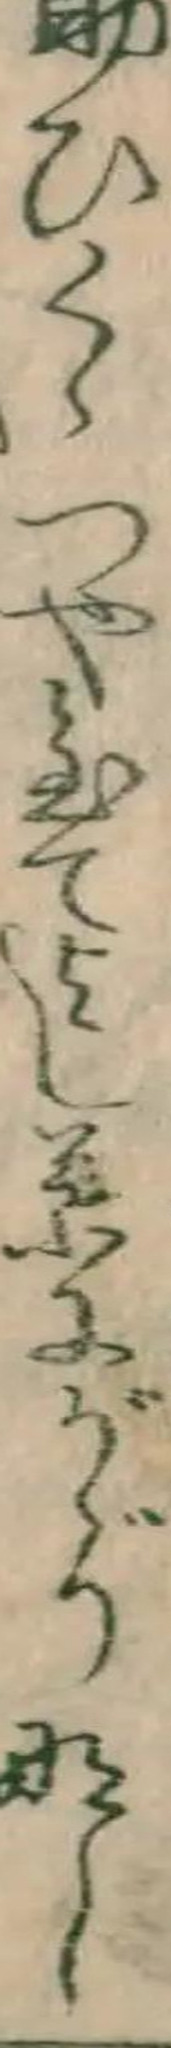葉の筋ひくゝつや至てよし葉にがゞりなし
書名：草木奇品家雅見 3巻. [3]
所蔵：国立国会図書館 National Diet Library, JAPAN
